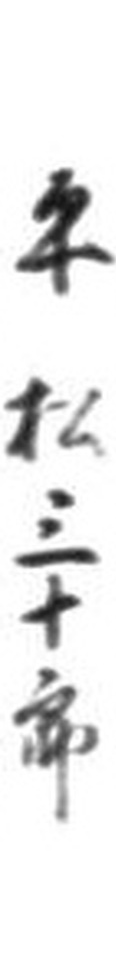平松三十郎
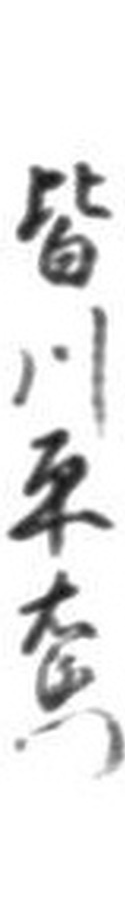皆川平右衛門
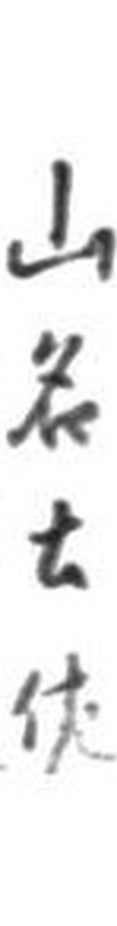山名土佐
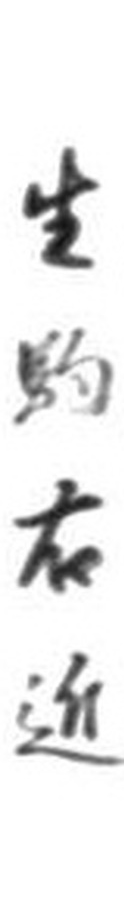生駒右近
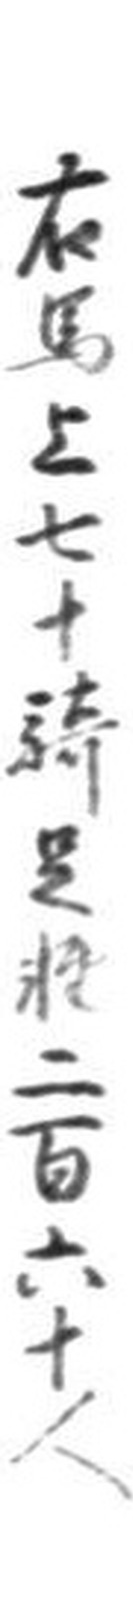右馬上七十余騎足軽二百六十人
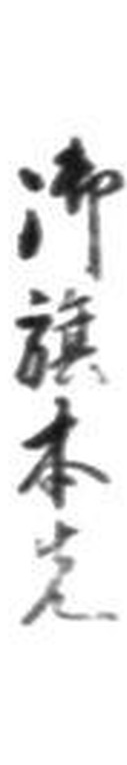御旗本先
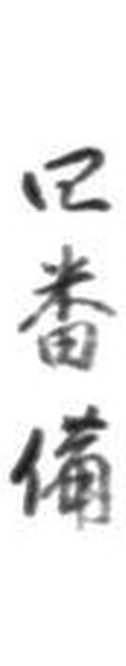四番備
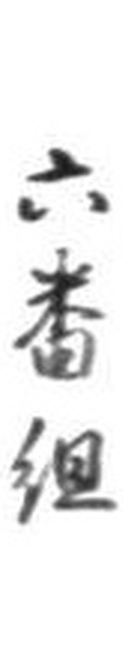六番組
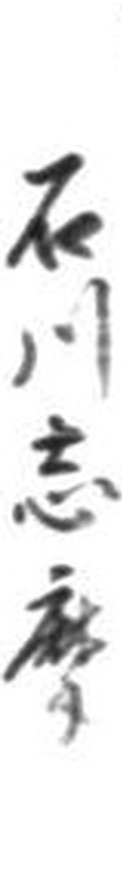石川志摩
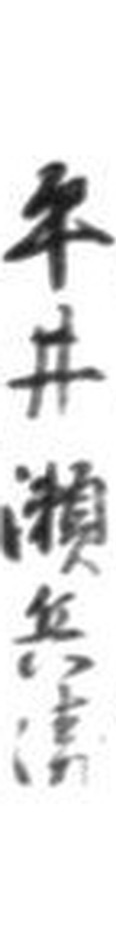平井瀬兵衛
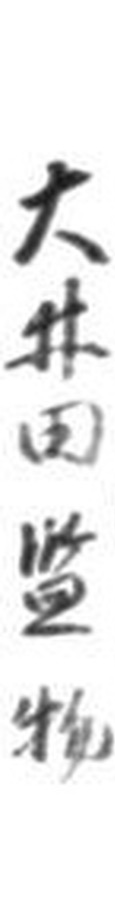大井田監物

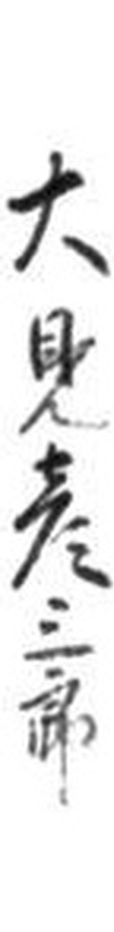大見彦三郎
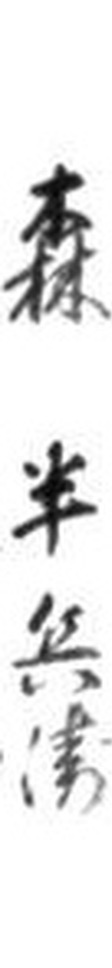森半兵衛
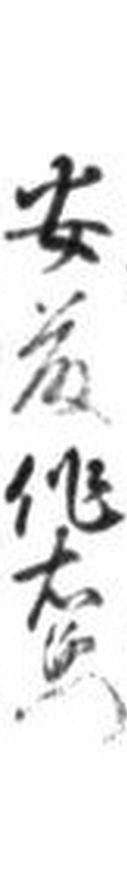安藤作右衛門
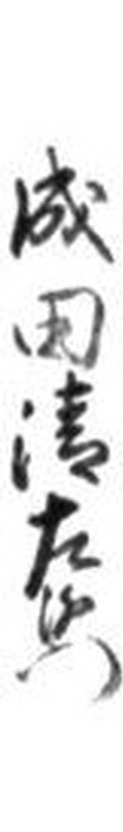成田清左衛門
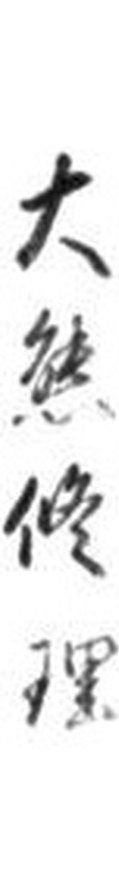大熊修理
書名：家譜 二 忠直公 従文禄四年到慶安四年
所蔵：福井県文書館 Fukui Prefectural Archives
